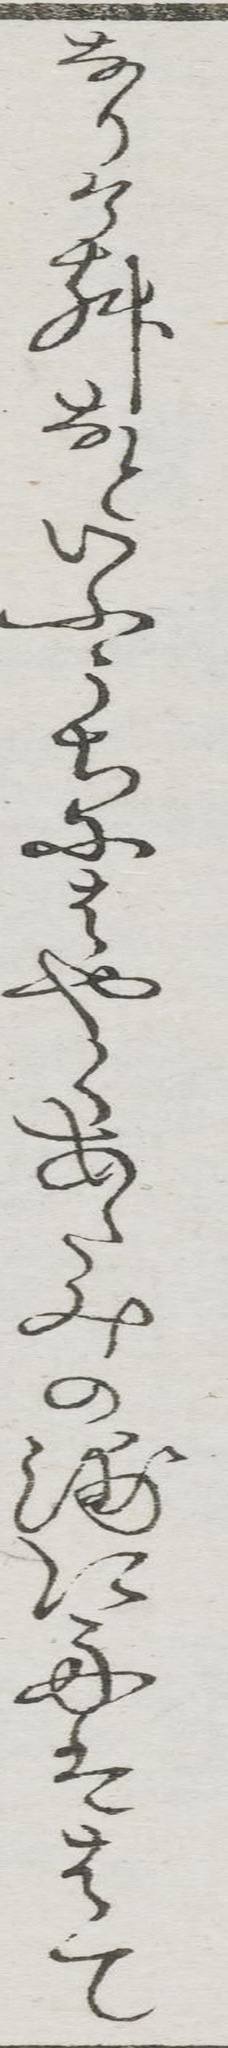なりけむなといふうちにはやくあたみの浦に舟ははて
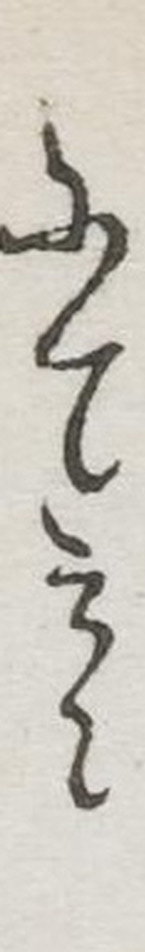にて云々
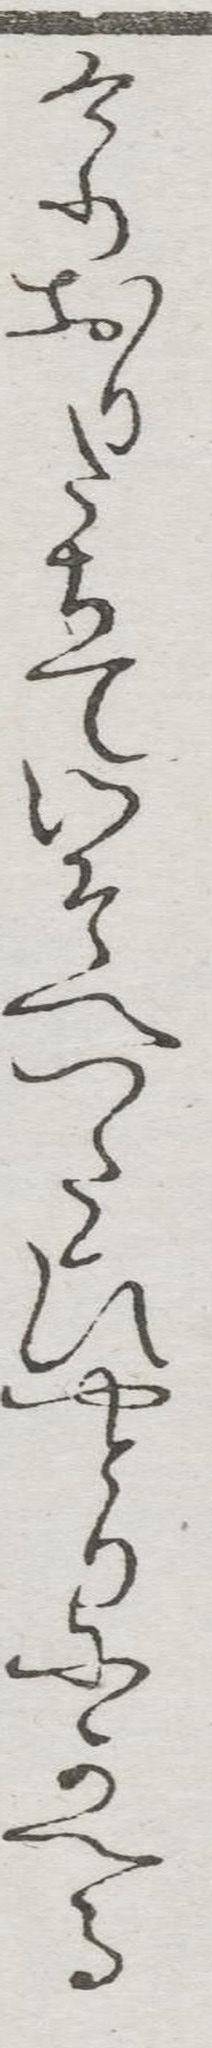けりおりたちていそへつたひやとりにかへる
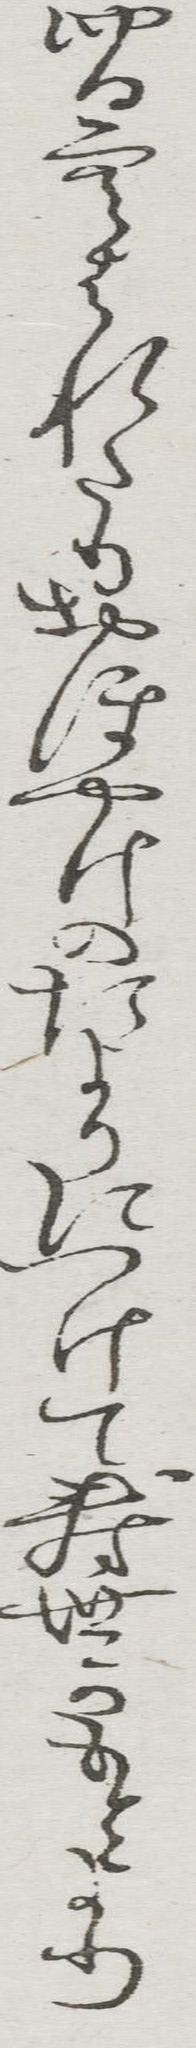四日空はれたりおほやけのたよりにつけて寿世かもとより
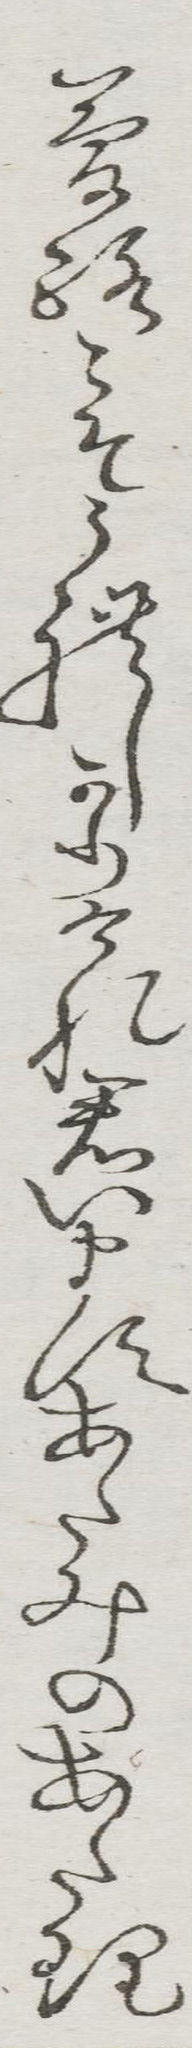夢路とそうれしかりけれ君いますあたみのあたり
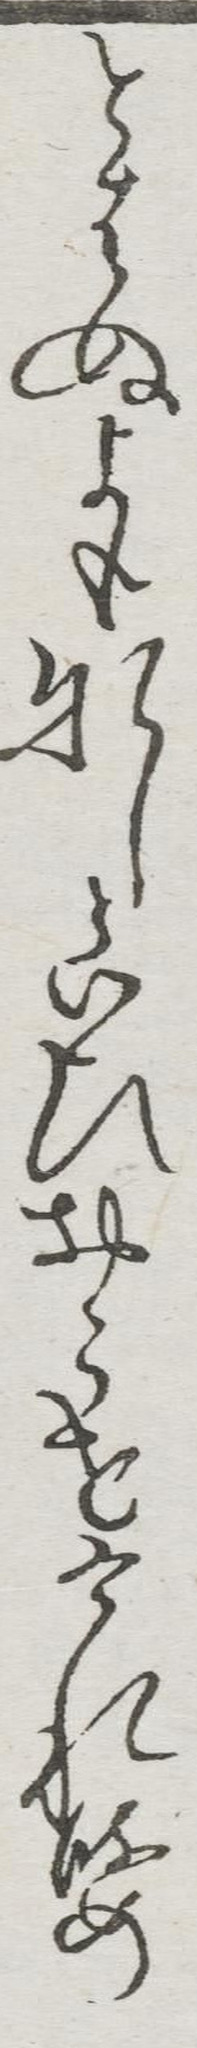とはぬよもなしといひおこせけれは
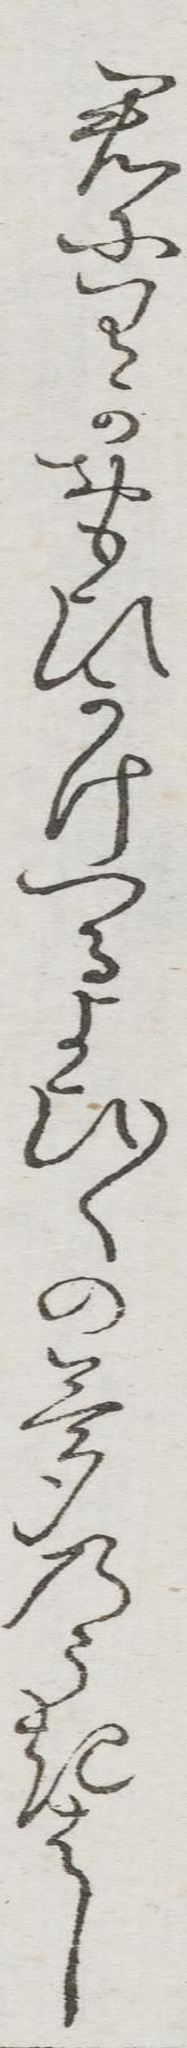君にわかおもひかけつるよひ〳〵の夢のうきはし
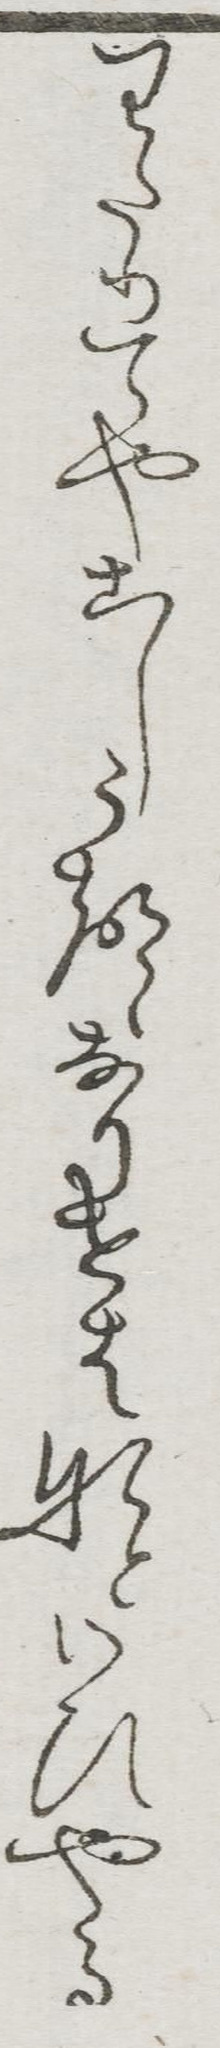わたりてやこしうつゝなりせはなといひやる
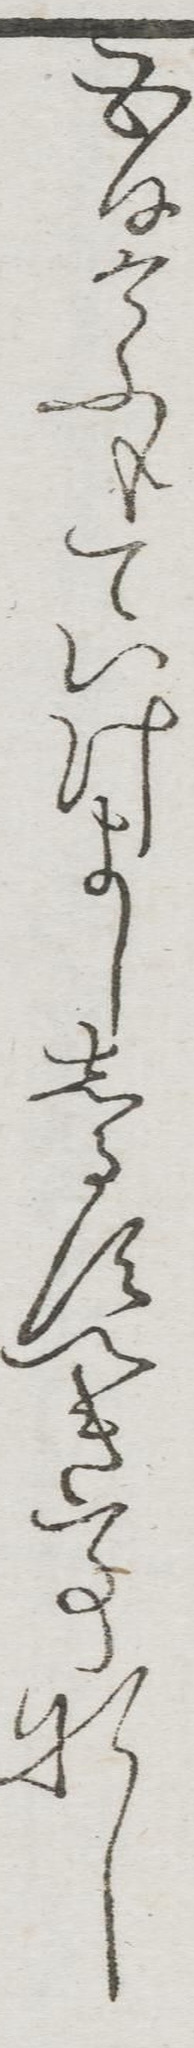五日けふもていけよししるすへき事なし
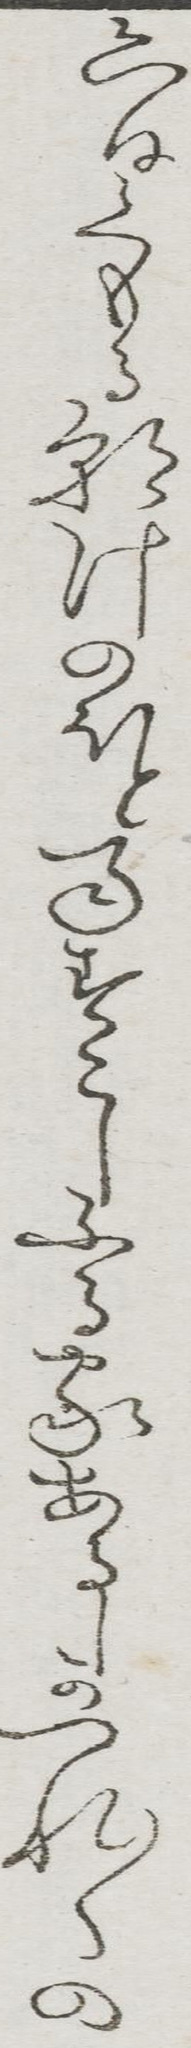六日くもる朝けのほと雨すこしふる家あるしかつれ〳〵の
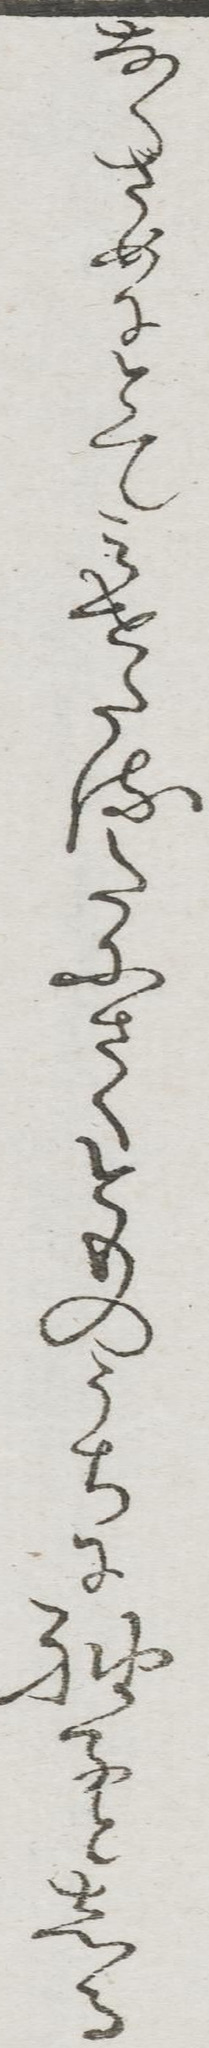なくさめにとてみせたるたにさくとものうちに袖子としる
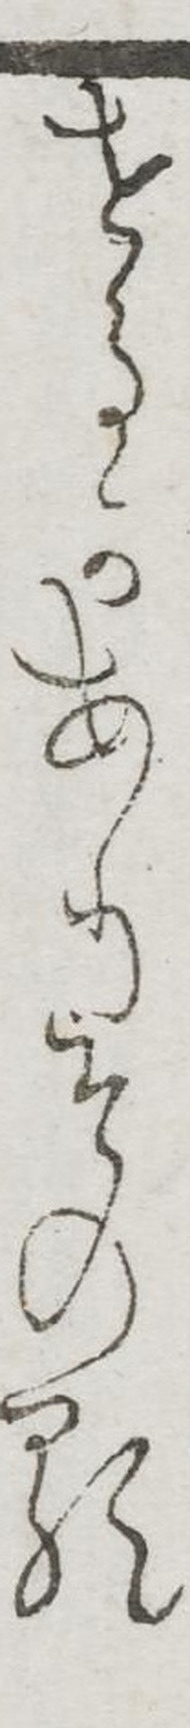せるかありその歌
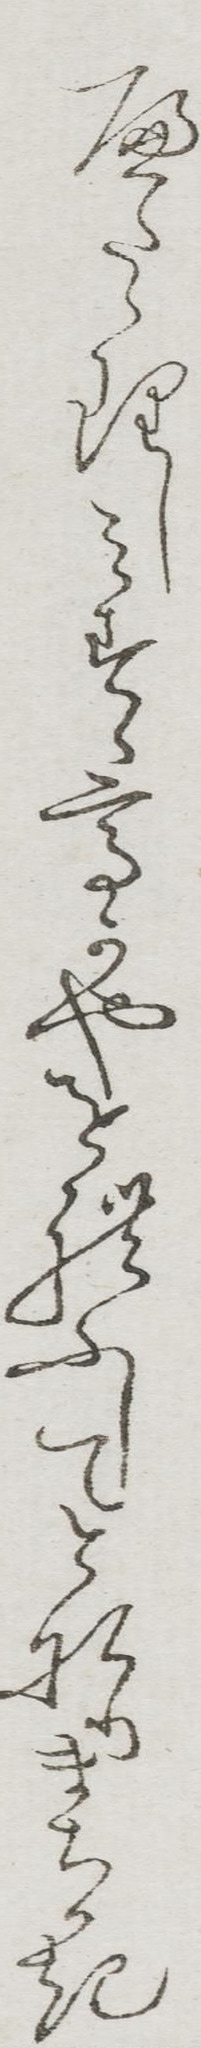へたゝりしみすゝ高かやをれふしてとなりまちかき
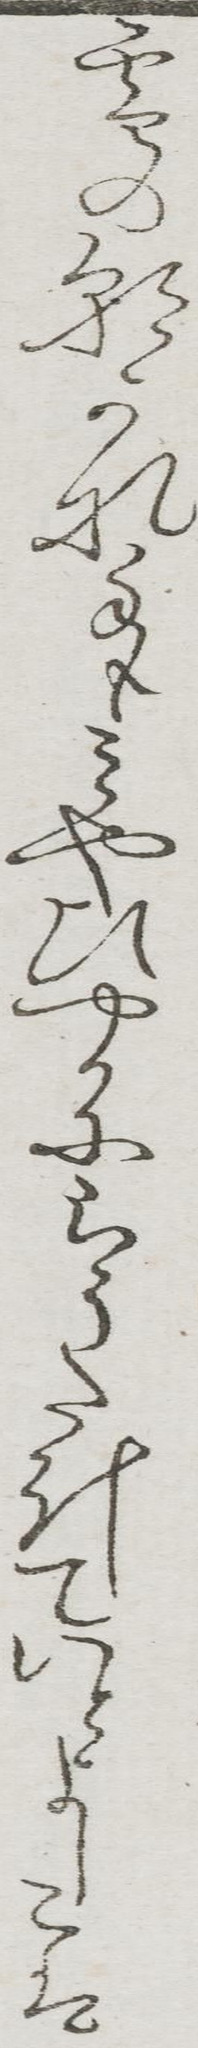雪の朝かな手もみやひやかにらうたけていとよしこは
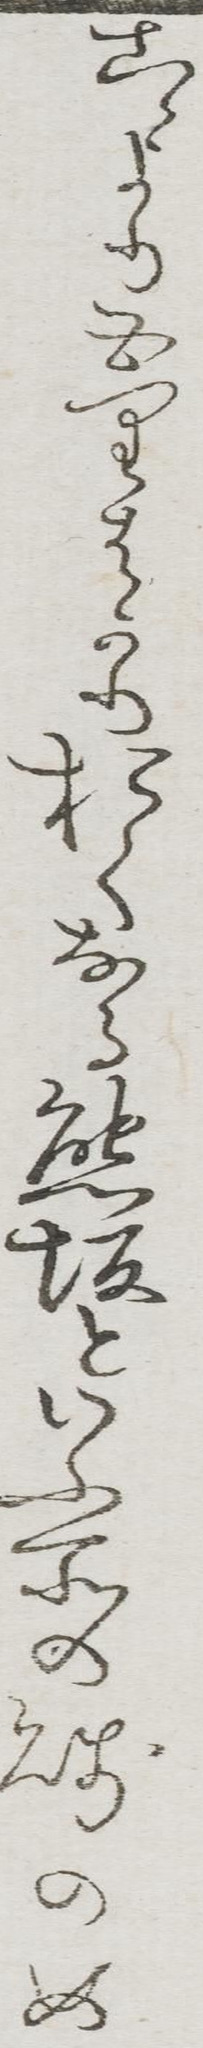こゝより五里はかりおくなる熊坂といふ所の賎のめ
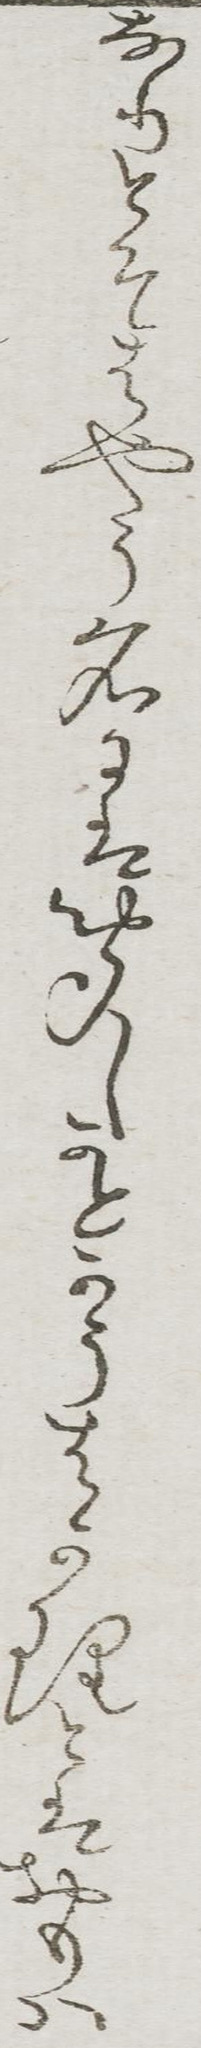なりとそはやう名には聞しかとかうはかりとはおもは
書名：挿画熱海日記　全
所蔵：東京大学地震研究所図書室 Earthquake Research Institute Library, The University of Tokyo, JAPAN
